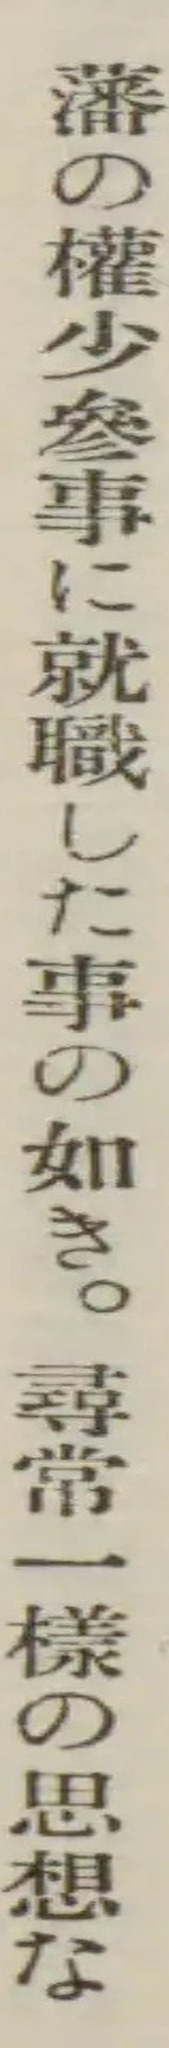藩の権少参事に就職した事の如き。尋常一様の思想な
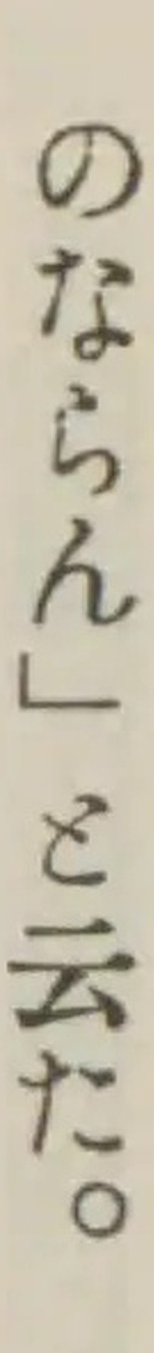のならん」と云た。
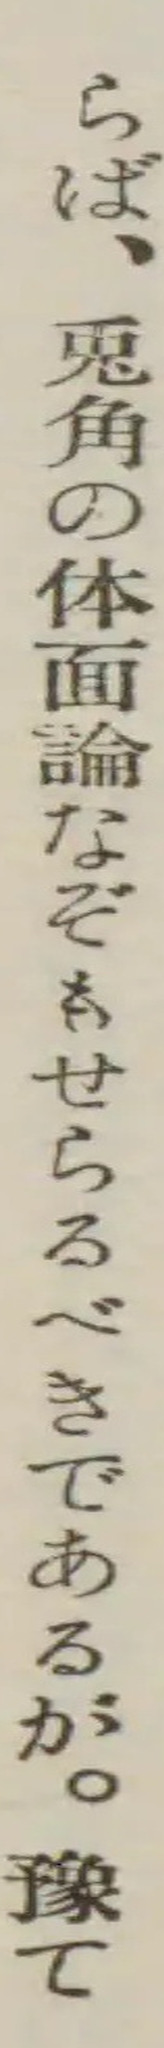らば、兎角の体面論なぞもせらるべきであるが。予て
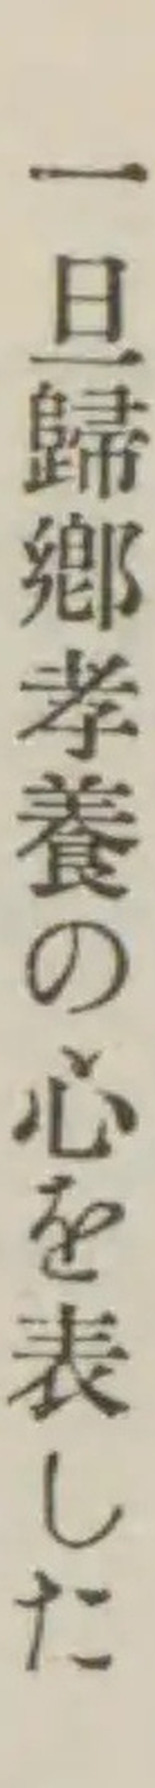一旦帰郷孝養の心を表した
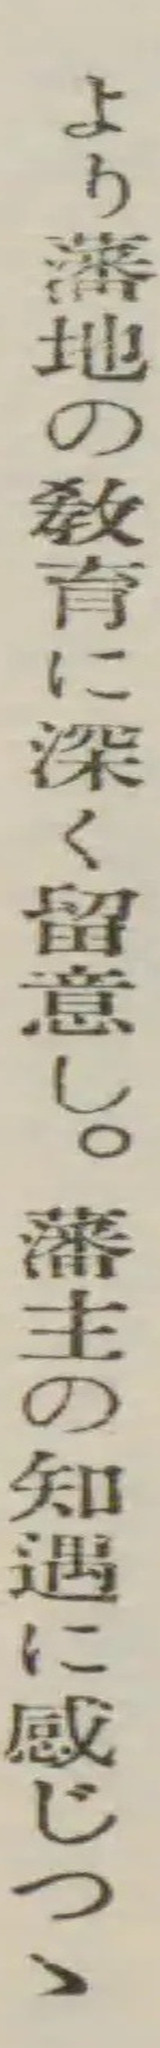より藩地の教育に深く留意し。藩主の知遇に感じつゝ
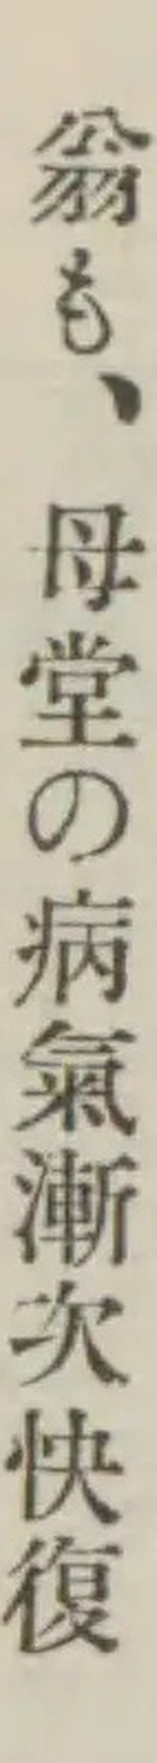翁も、母堂の病気漸次快復
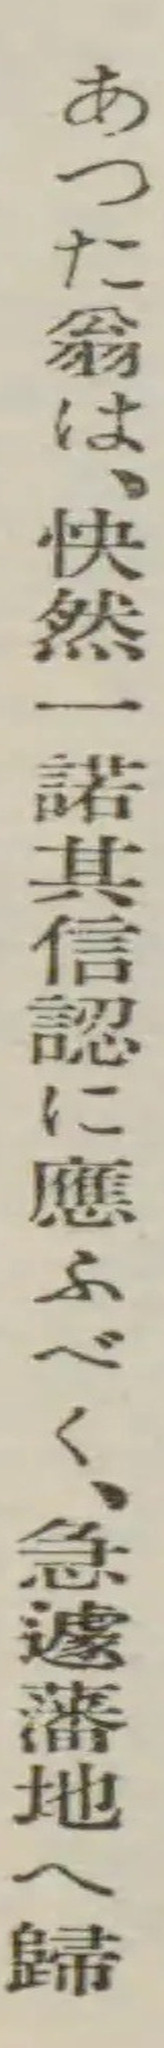あつた翁は、快然一諾信認に応ふべく、急遽藩地へ帰
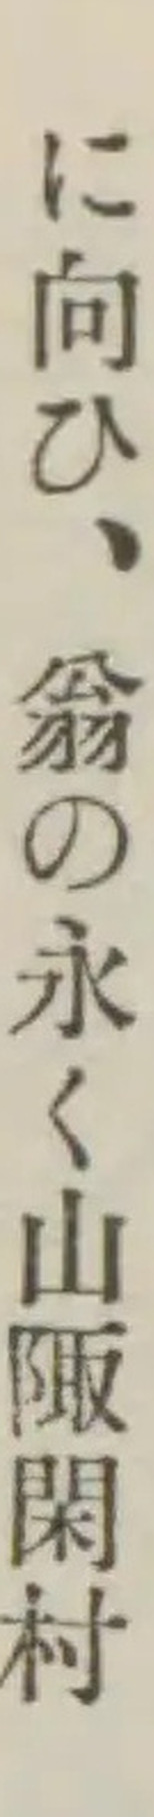に向ひ、翁の永く山陬閑村
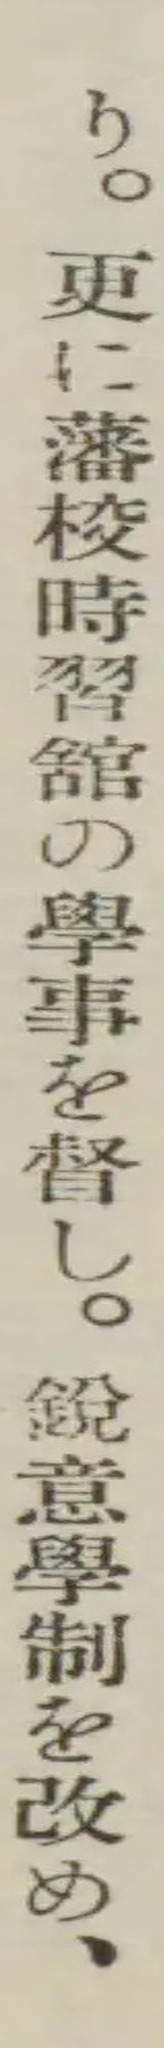り。更に藩校時習館の学事を督し。鋭意学制を改め、
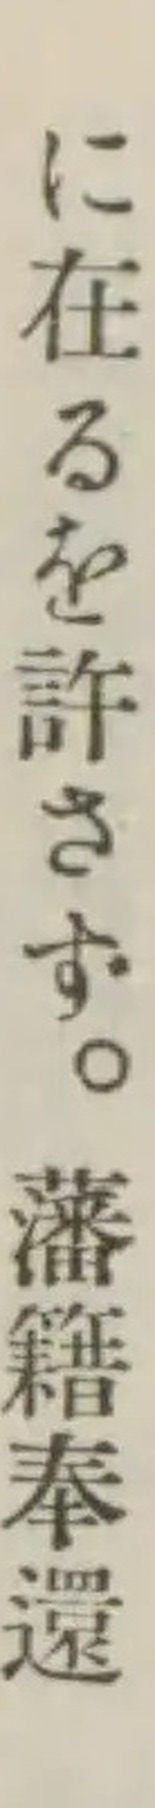に在るを許さず。藩籍奉還
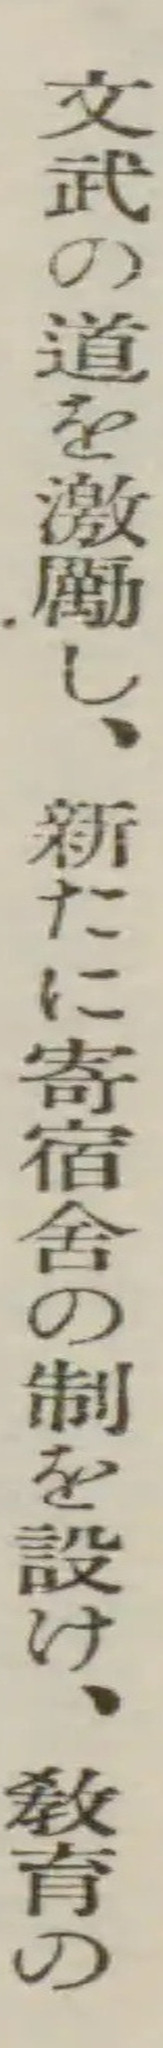文武の道を激励し、新たに寄宿舎の制を設け、教育の
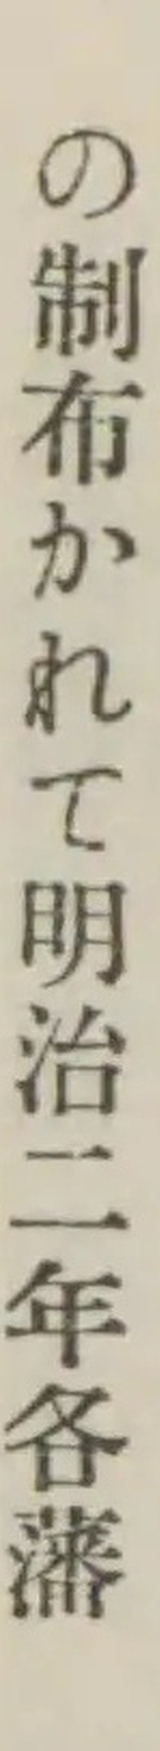の制布かれて明治二年各藩
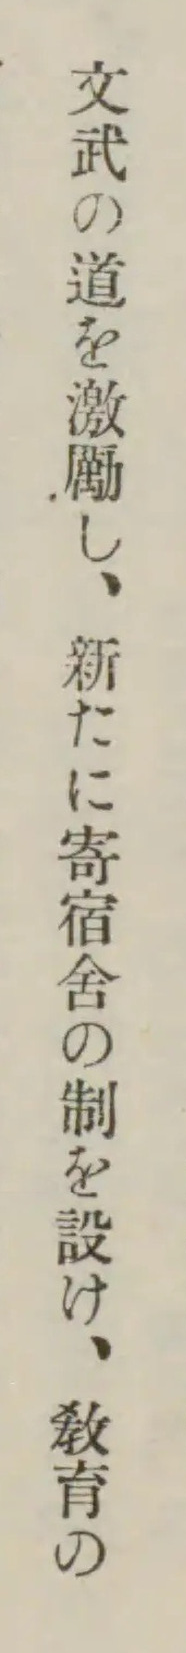文武の道を激励し、新たに寄宿舎の制を設け、教育の
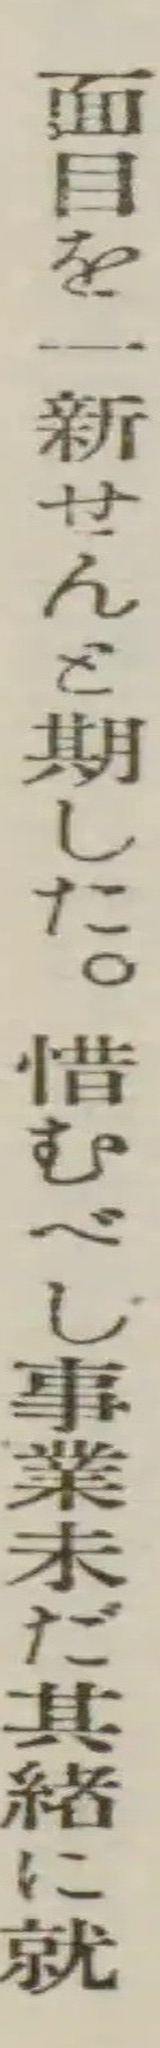面目を一新せんと期した。惜むべし事業未だ其緒に就
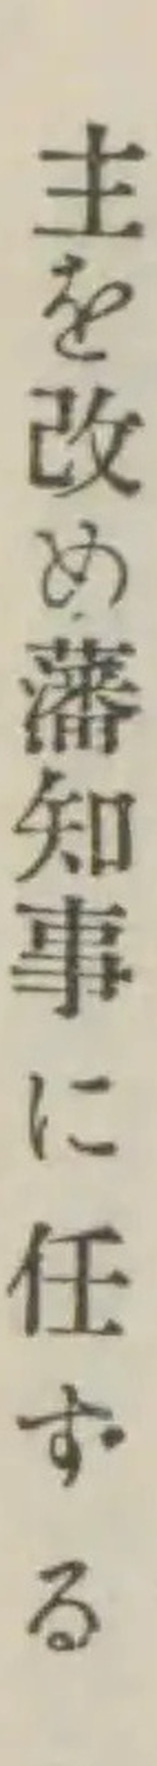主を改め潘知事に任ずる
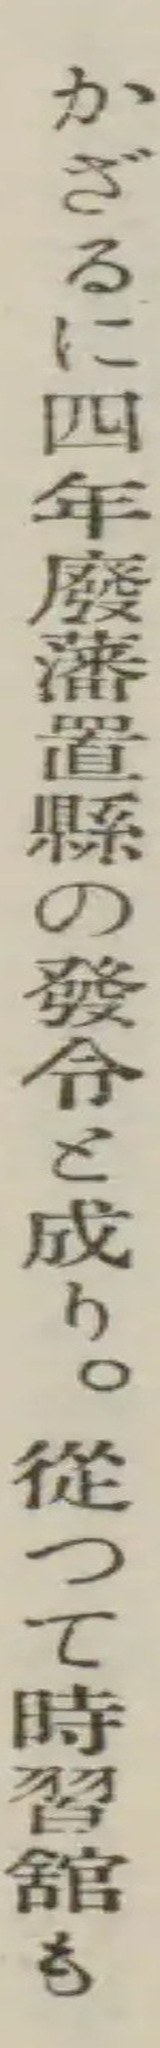かざるに四年廃藩置県の発令と成り。従つて時習館も
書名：小野湖山翁小伝
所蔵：国立国会図書館 National Diet Library, JAPAN
